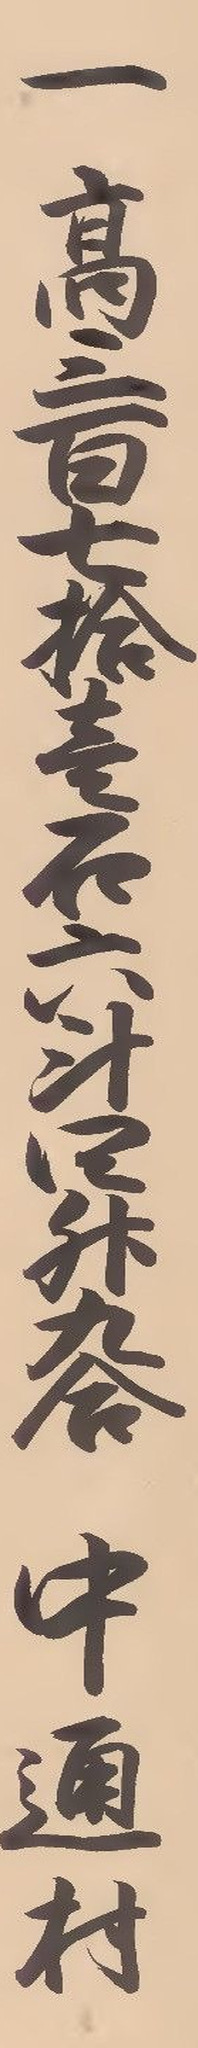一高三百七拾壱石六斗四升九合中通村
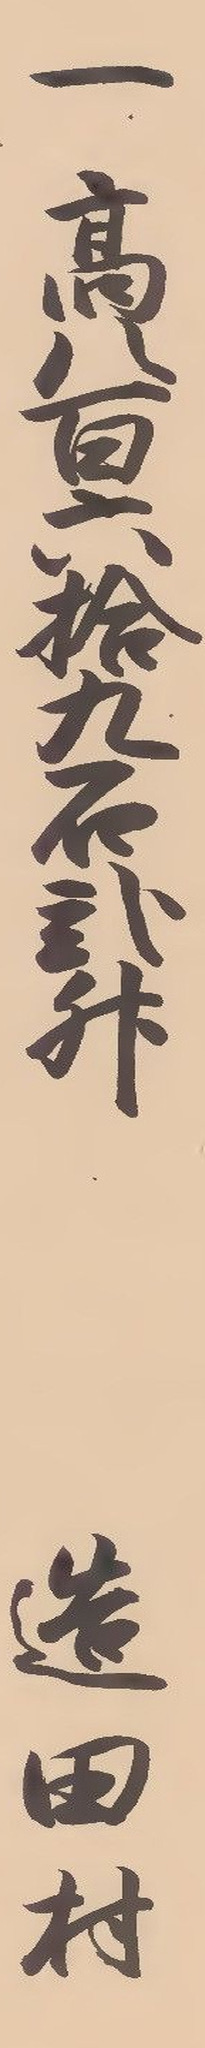一高八百六拾九石弐升造田村
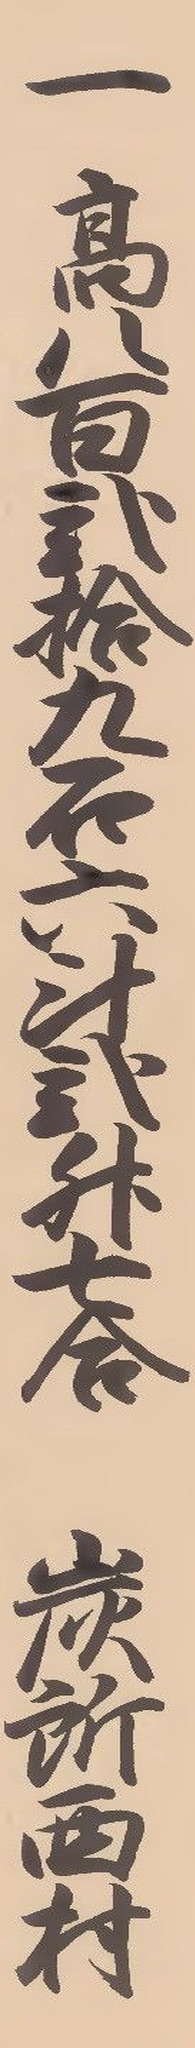一高八百弐拾九石六斗弐升七合炭所西村
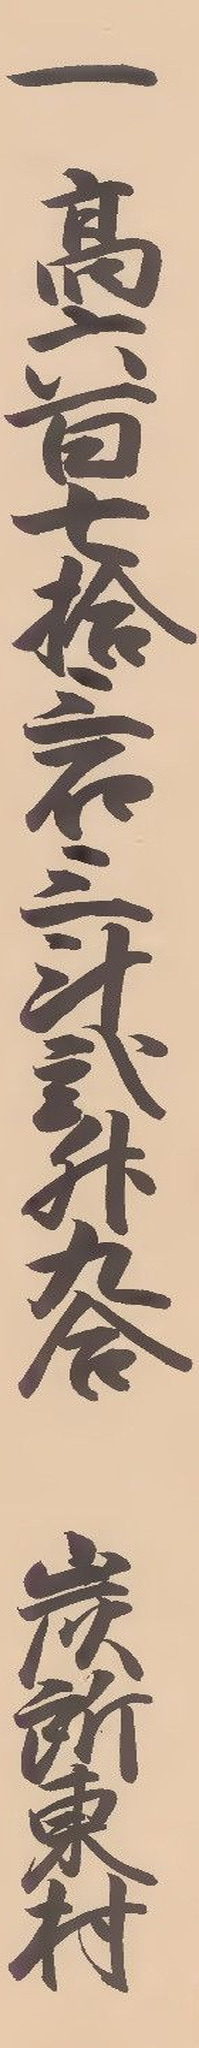一高六百七拾三石三斗弐升九合炭所東村

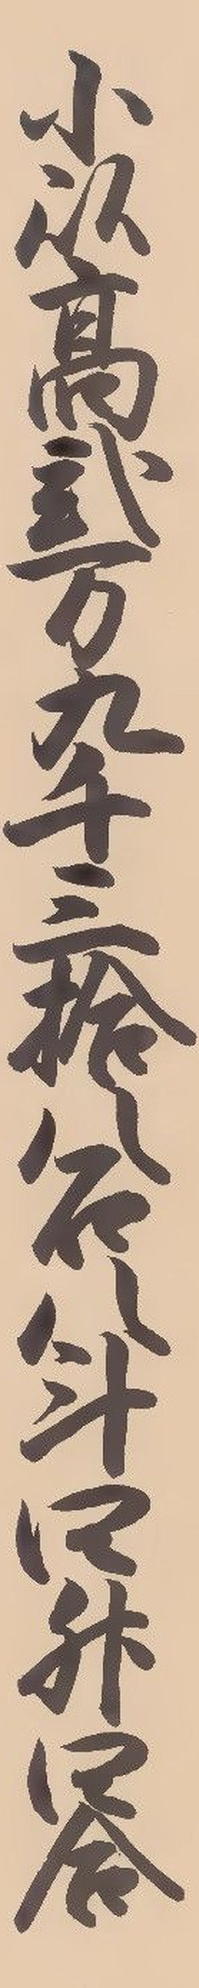小以高弐万九千三拾八石八斗四升四合
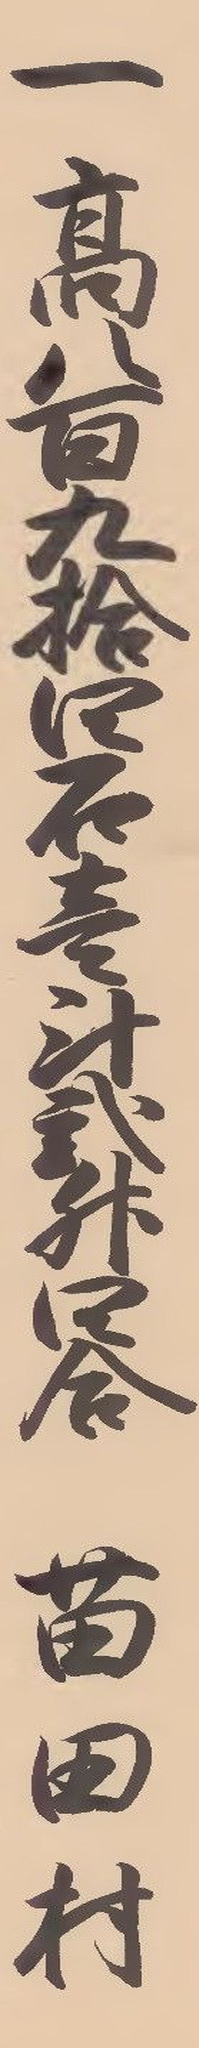一高八百九拾四石壱斗弐升四合苗田村
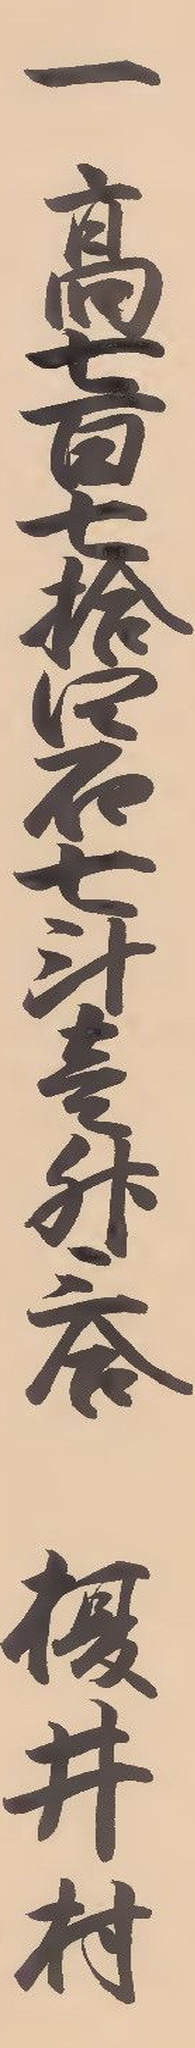一高七百七拾四石七斗壱升三合榎井村
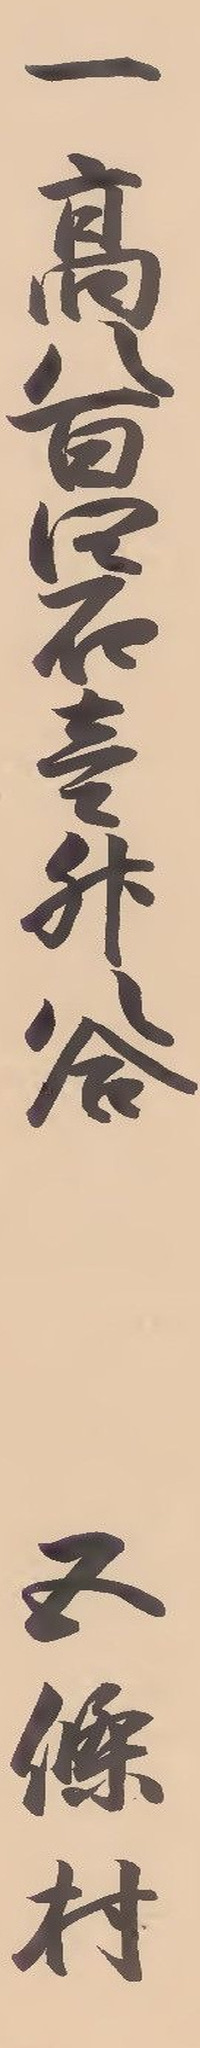一高八百四石壱升八合五条村

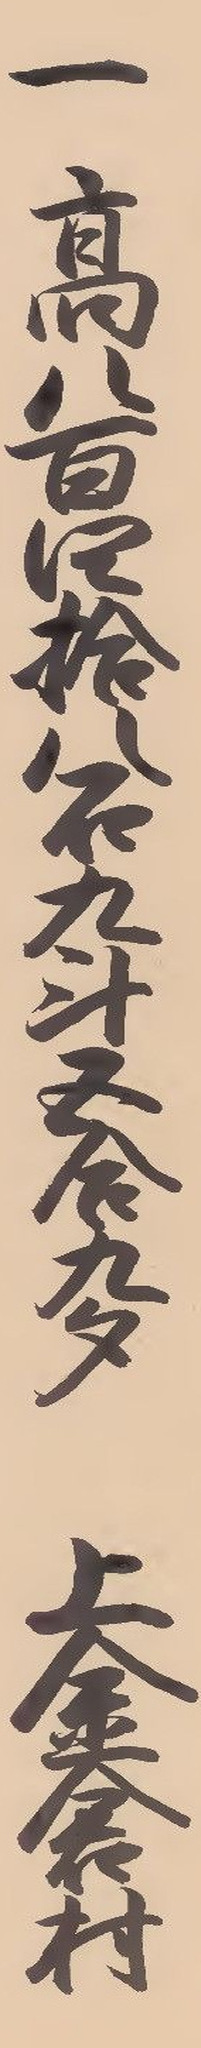一高八百四拾八石九斗五合九勺上金倉村
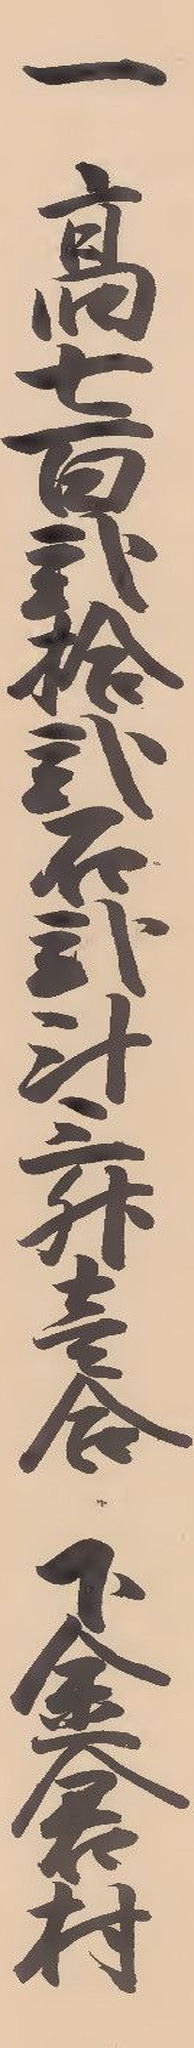一高七百弐拾弐石弐斗三升壱合下金倉村
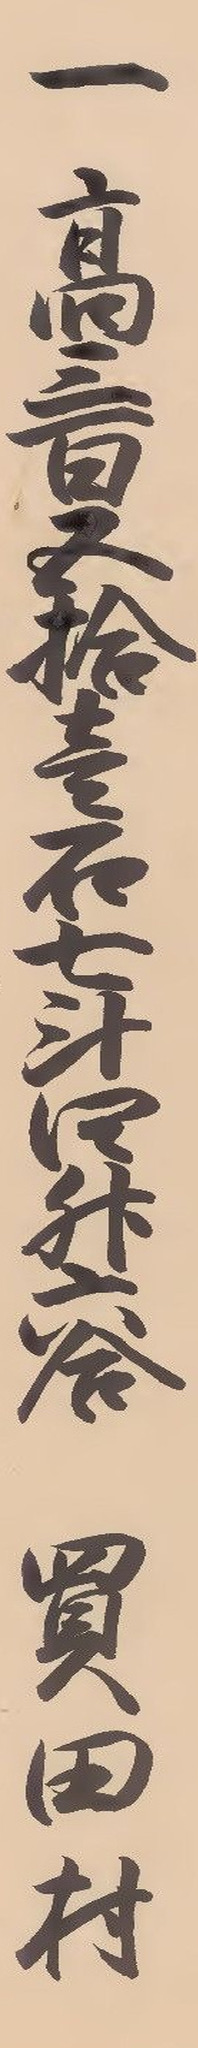一高三百五拾壱石七斗四升六合買田村
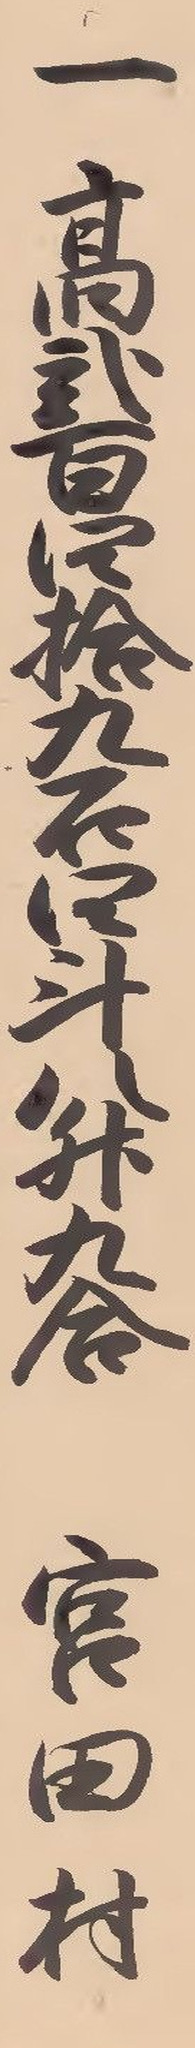一高弐百四拾九石四斗八升九合宮田村
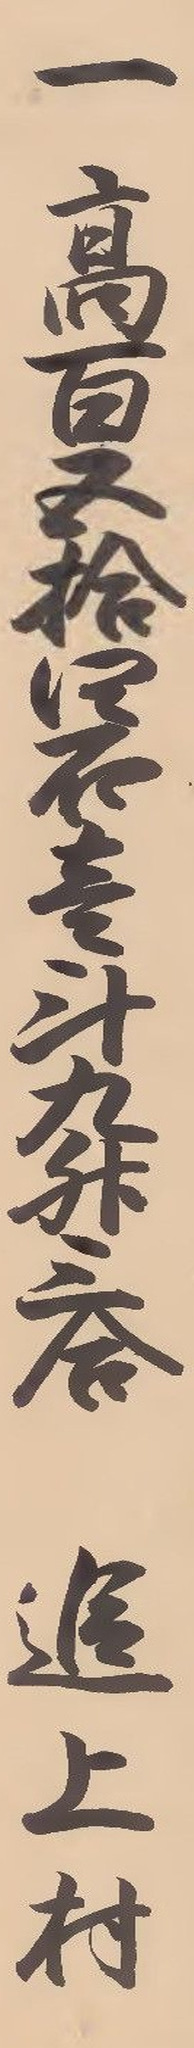一高百五拾四石壱斗九升三合追上村
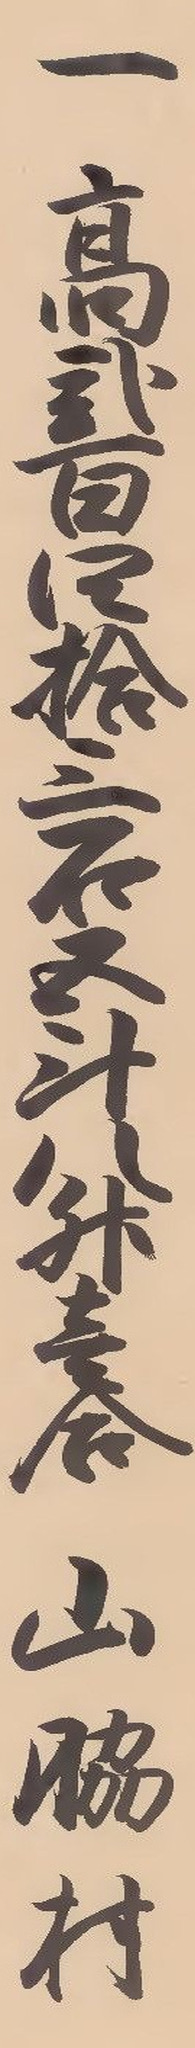一高弐百四拾三石五斗八升壱合山脇村
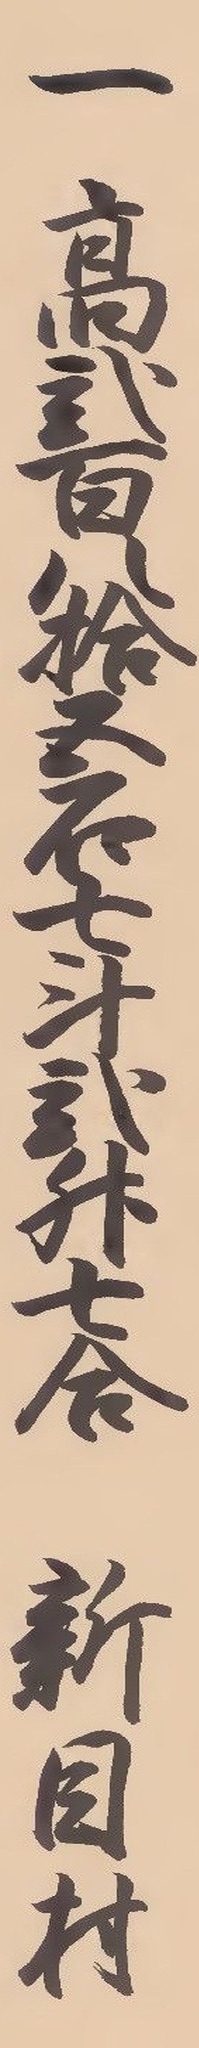一高弐百八拾五石七斗弐升七合新目村
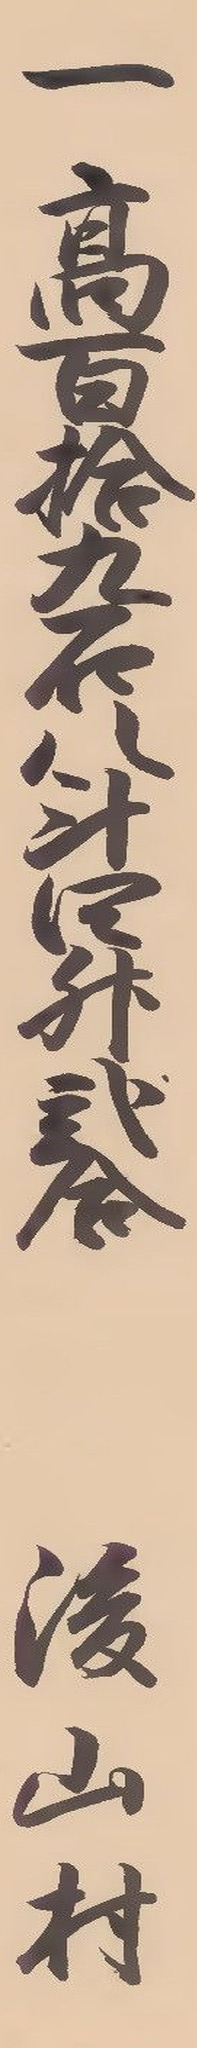一高百拾九石八斗四升弐合後山村
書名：讃岐国郷帳
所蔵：国立公文書館 National Archives of Japan
